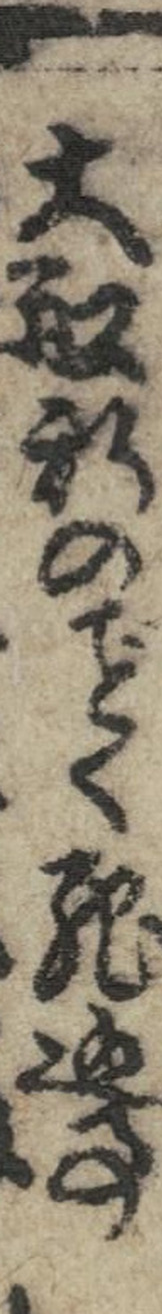大船斯のごとく馳込事
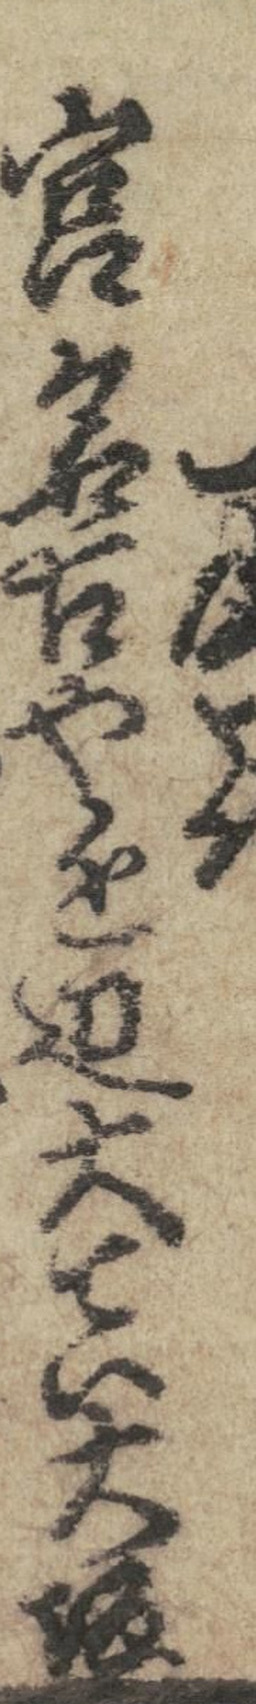宮名古や近辺大てい大坂
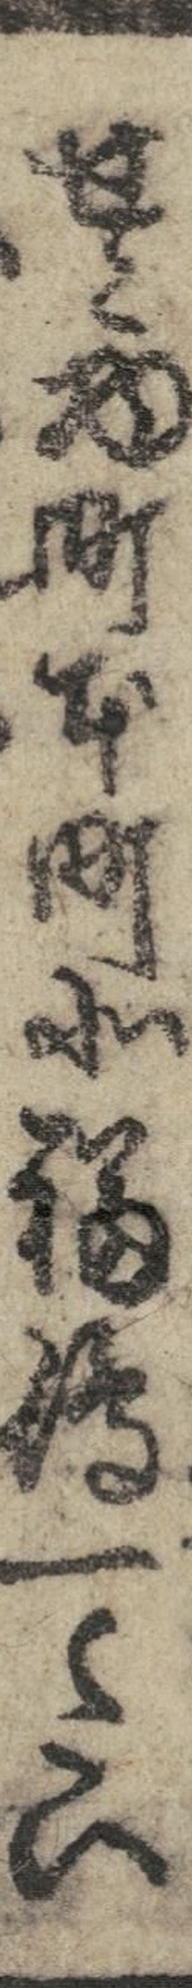せと物町本町北福嶋一たい
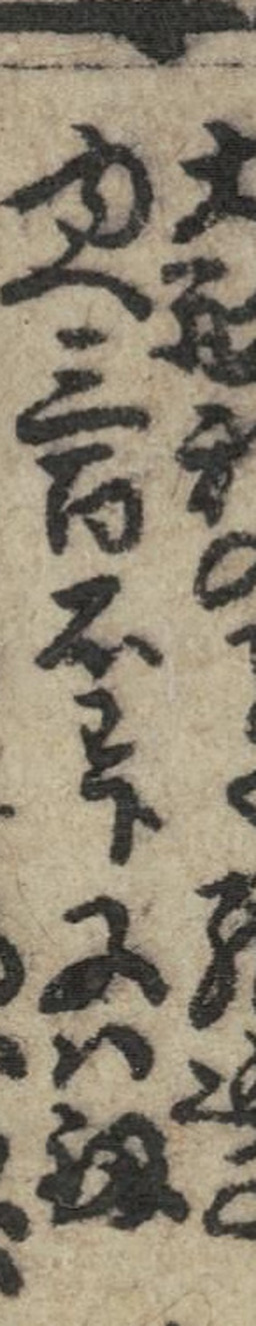ゆへ三百石已下又は釼
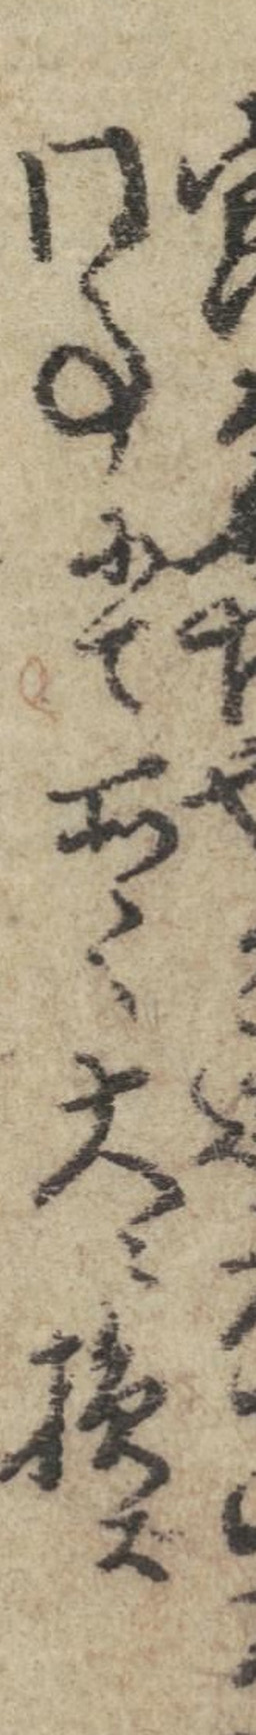同事にて所〻大に損ス
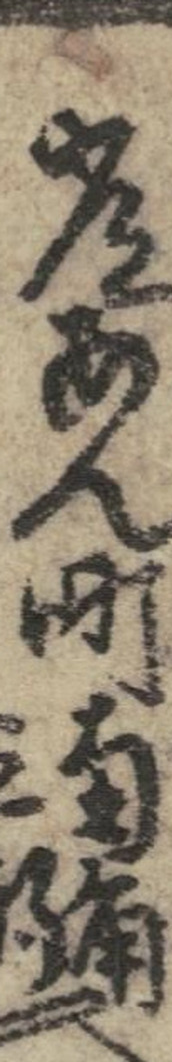道あん町南角
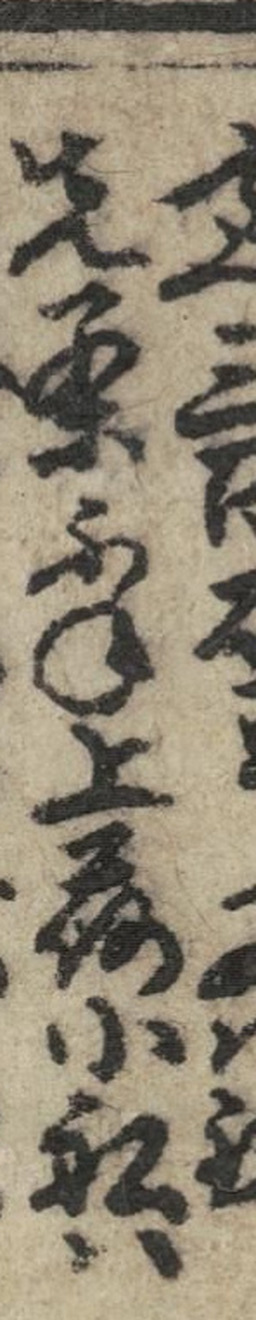先条ふね上荷小船は
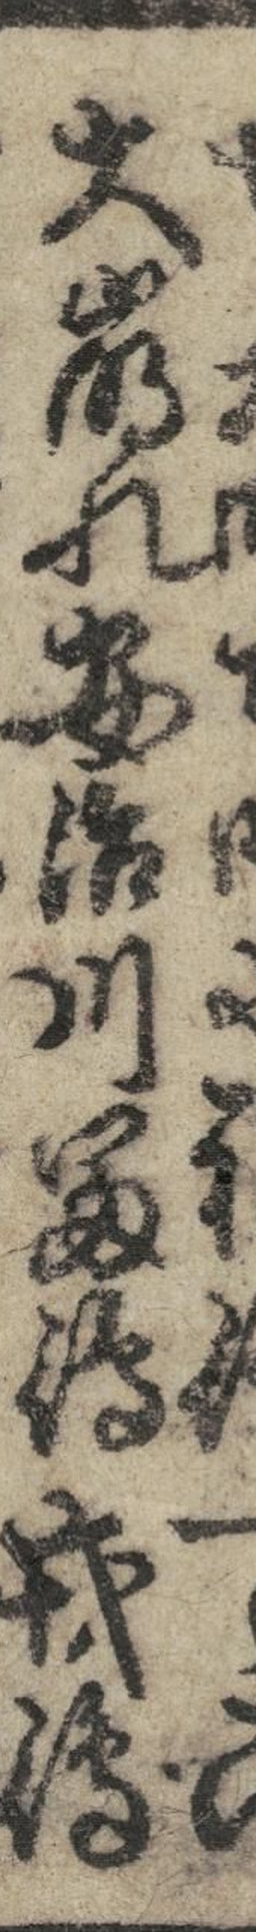大崩れ安治川留嶋戎嶋
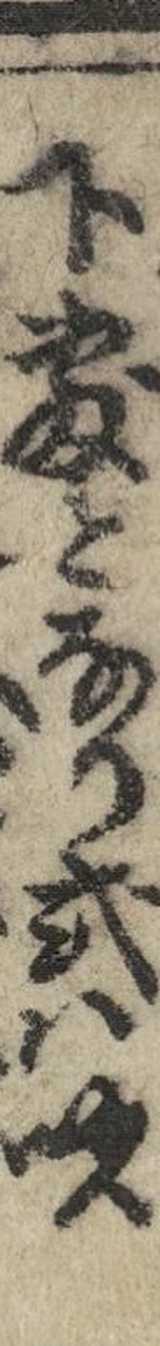下敷となり或は吹
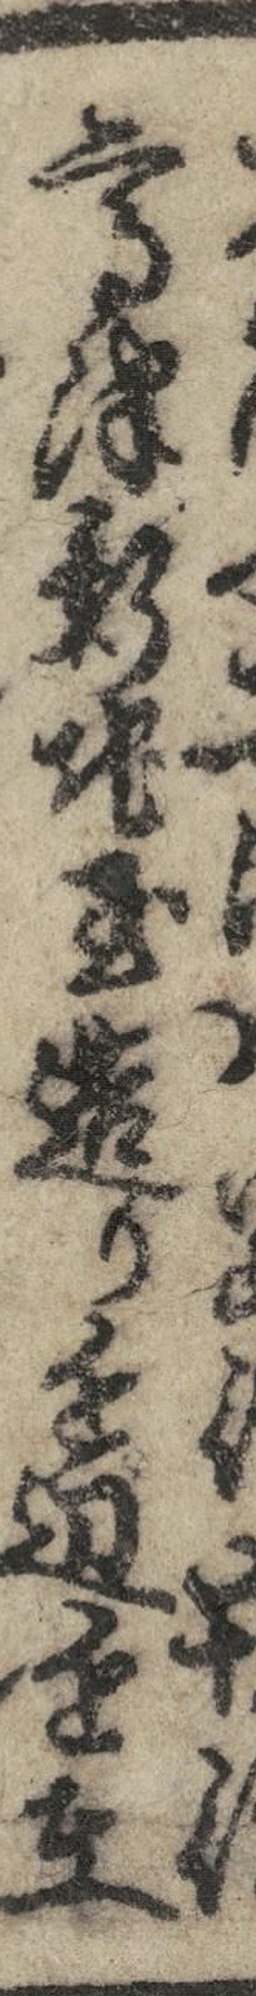高津新地玉造り近辺近在
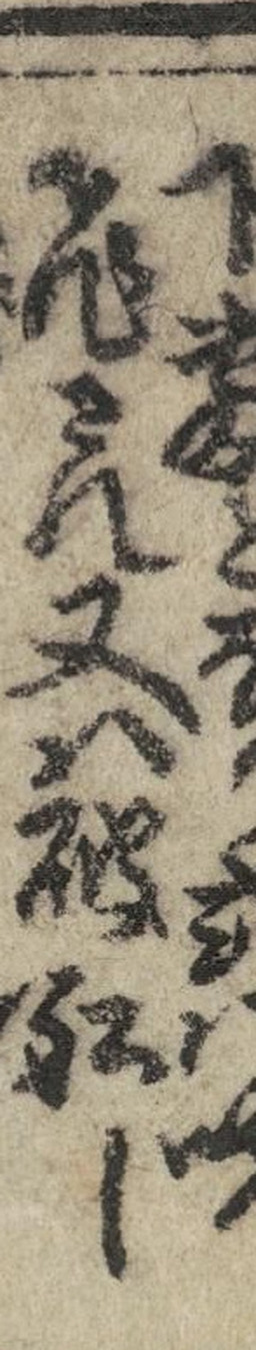飛され又は破船し
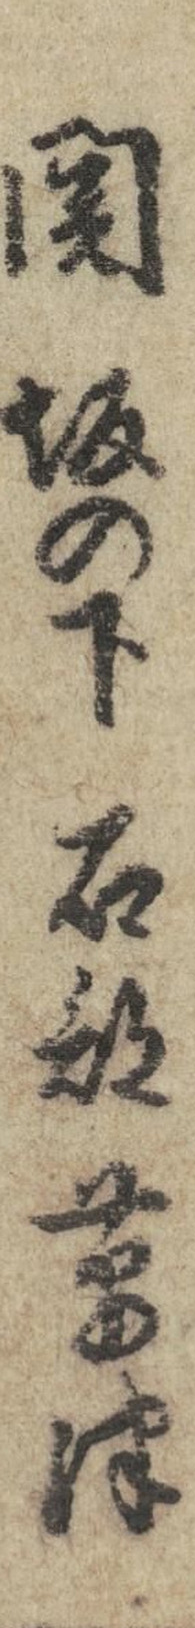関坂の下石部草津
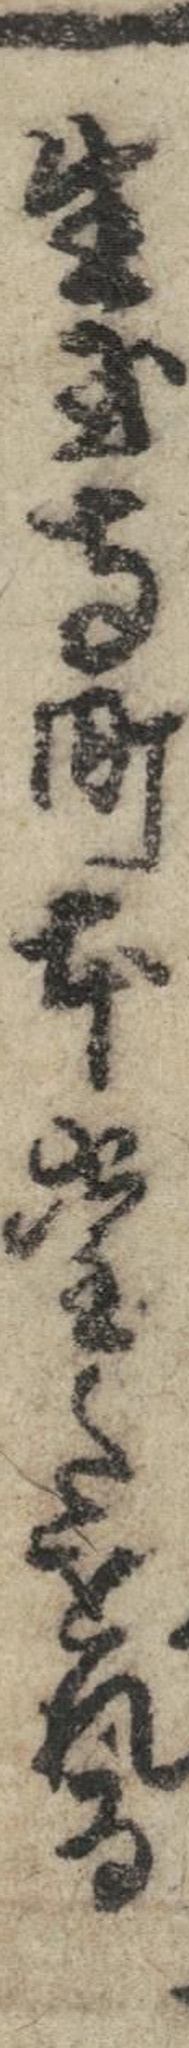生玉寺町本堂たをれる
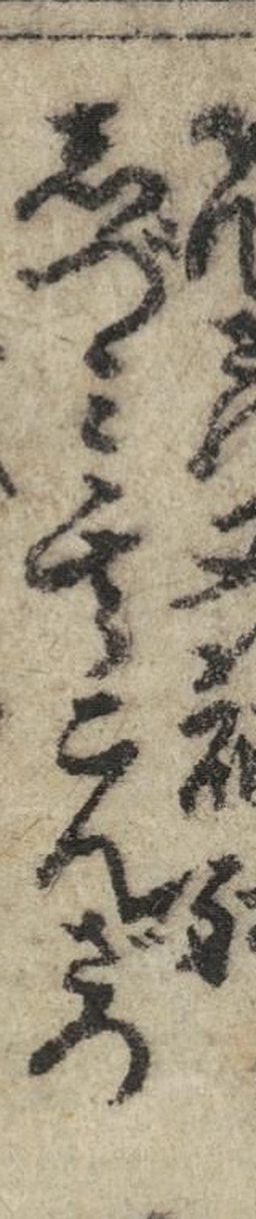しづみ其こんざつ
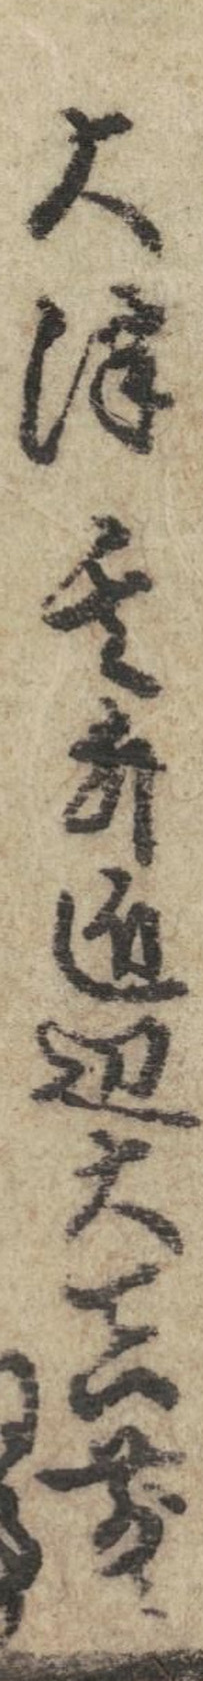大津其外近辺大てい前
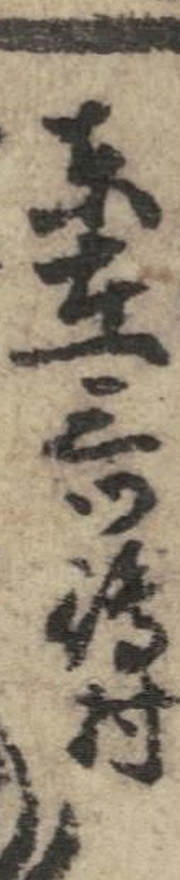東在三ツ嶋村
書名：諸国大阪太地震大つなミ末代噺
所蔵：東京大学地震研究所図書室 Earthquake Research Institute Library, The University of Tokyo, JAPAN
